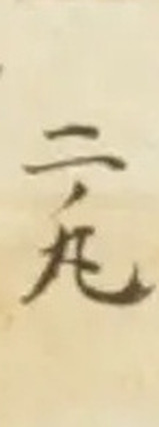二ノ丸
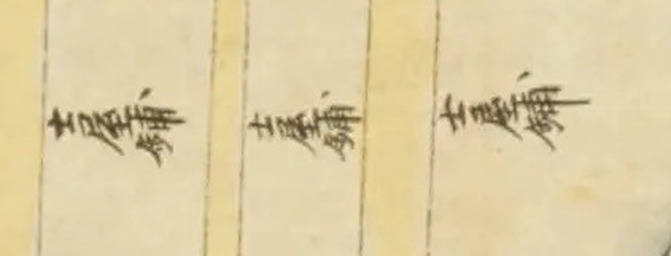士屋鋪士屋鋪士屋鋪
